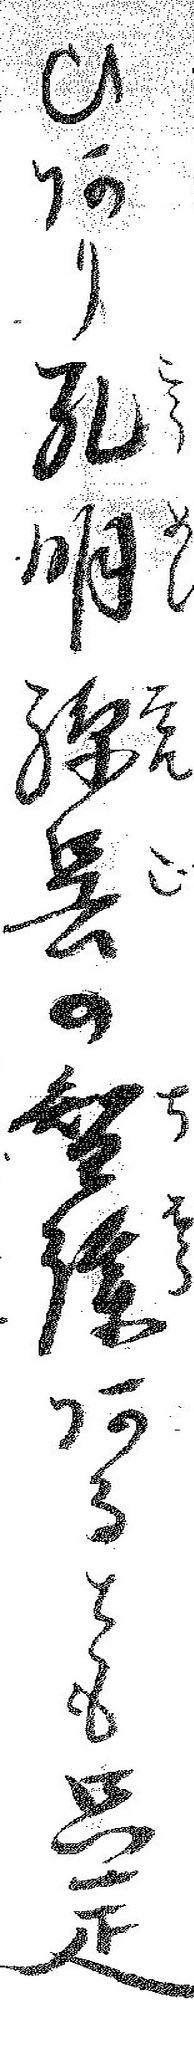ひあり孔明孫呉の智謀あるとも只一疋
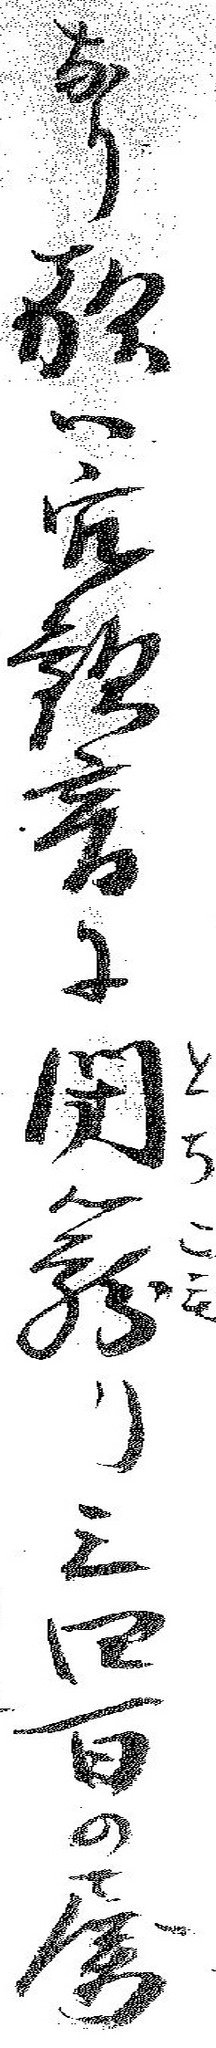なり敵は穴観音に閉籠り三四百の属
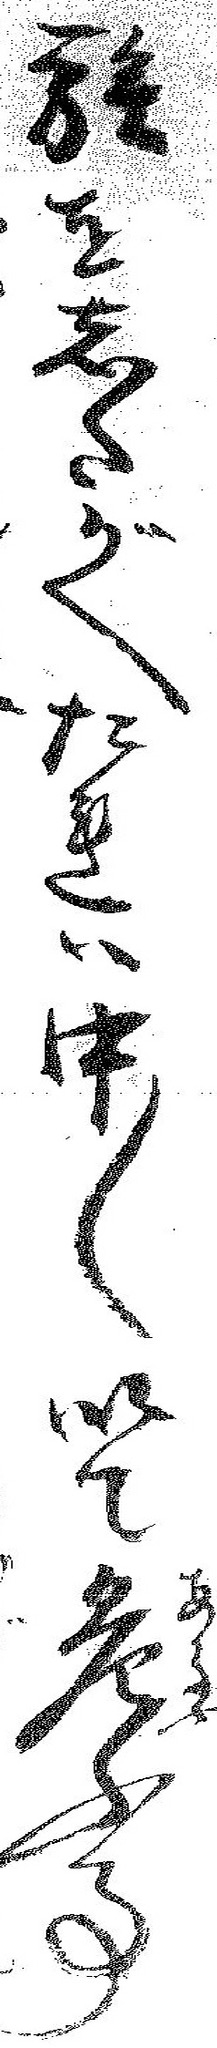族をしたがへたれは中〳〵以て危ふ事
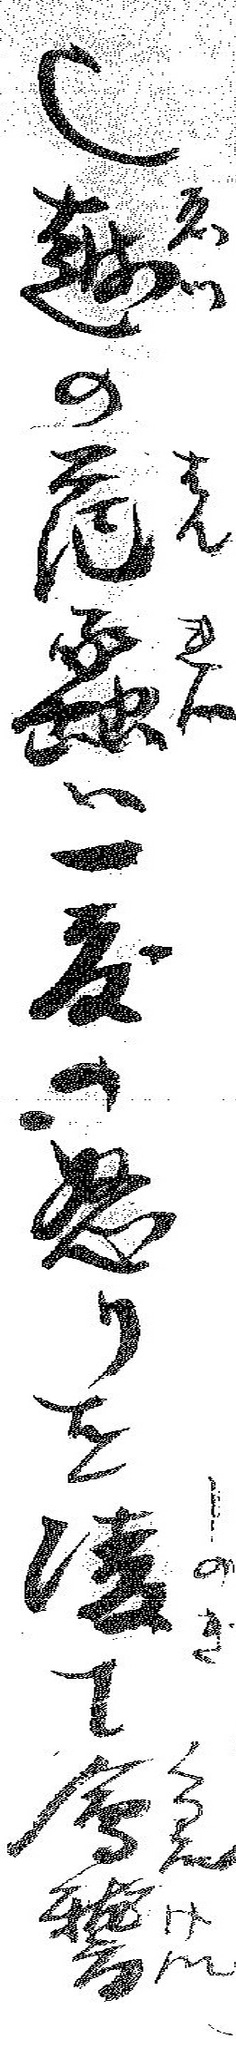也越の范蠡は一度の怒りを凌て会稽
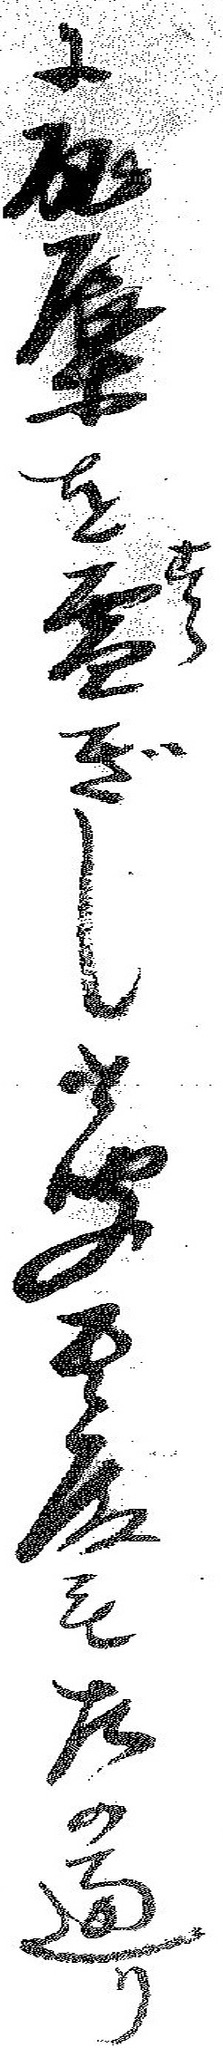に屈辱を雪ぎしと聞貴殿も左の通り
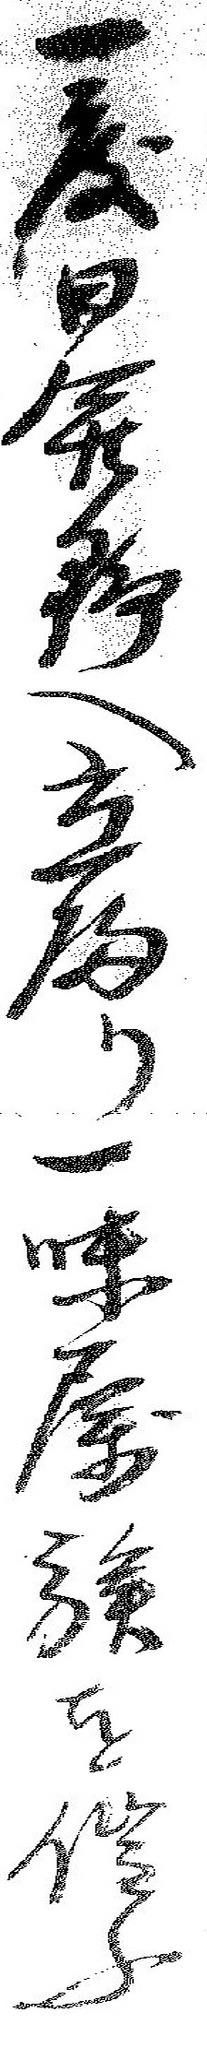一度日開野へ立帰り一味属族を催ふ
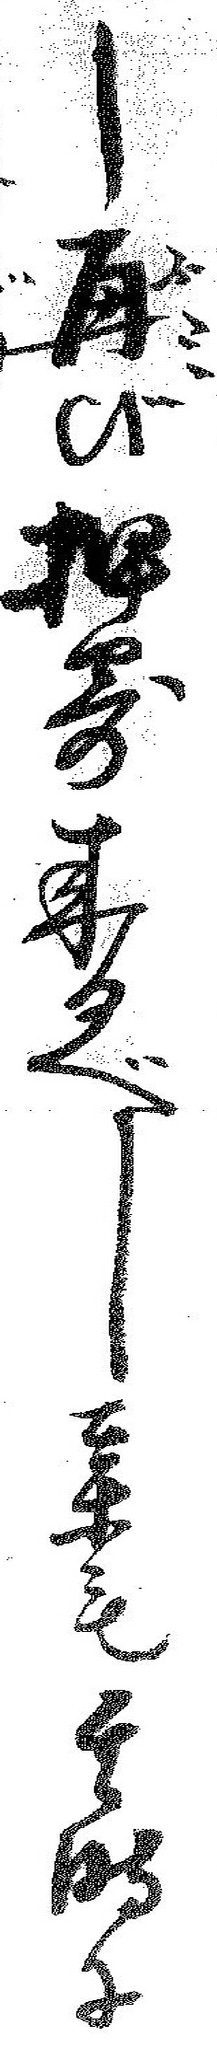し再び押寄来るべし某も其時に
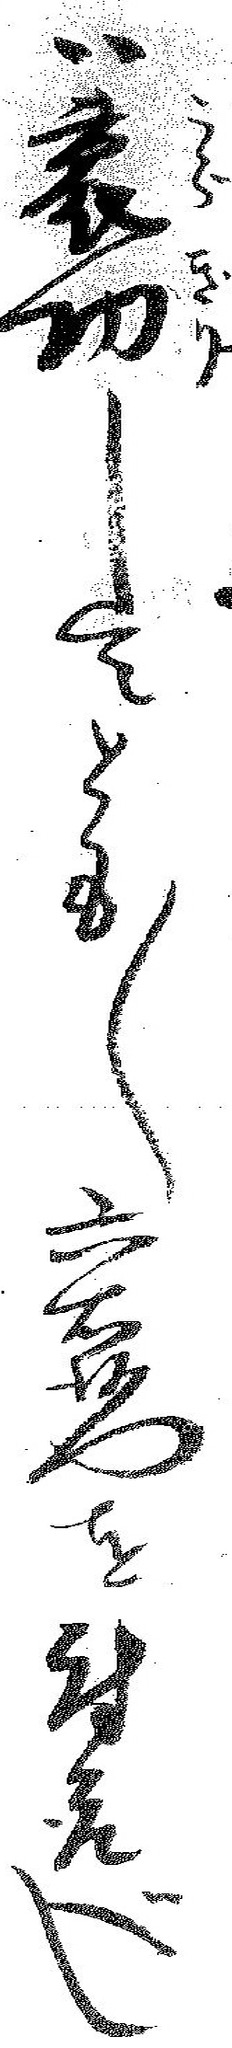は裏切してとも〳〵六右衛門を討取べし
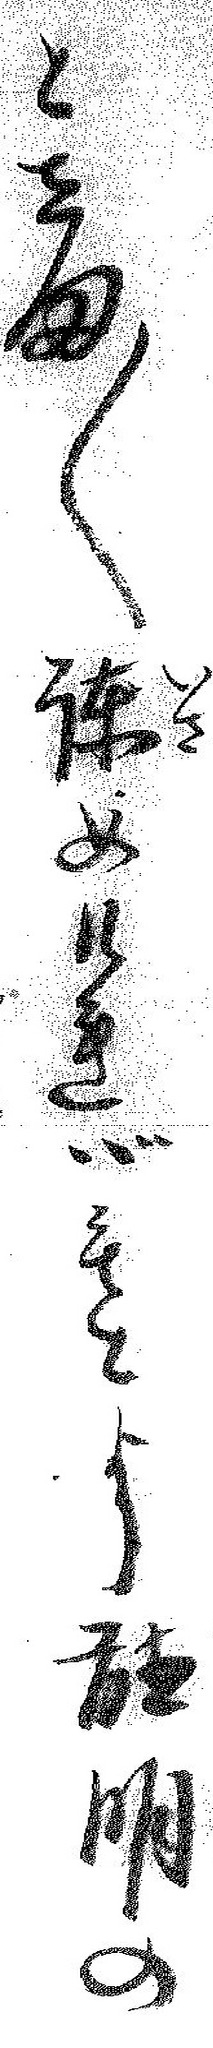とさま〳〵諫めければもとより聡明の
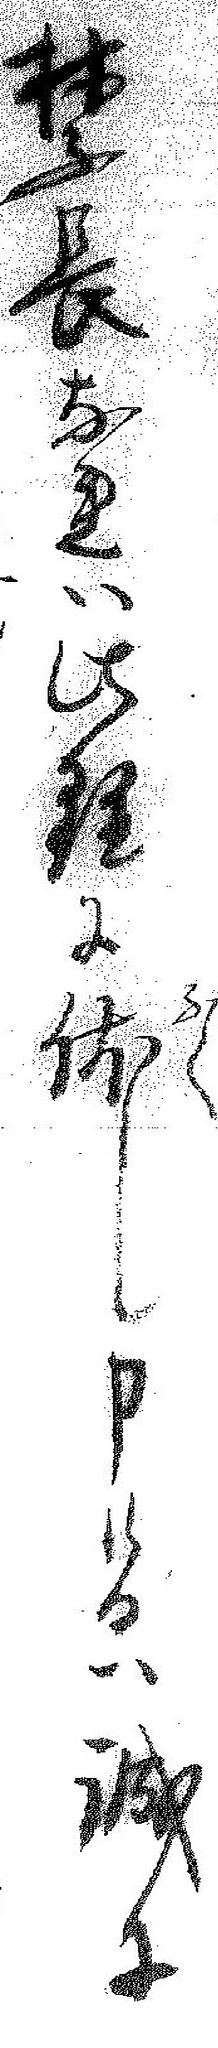禁長なれは此理に伏し申けるは誠に
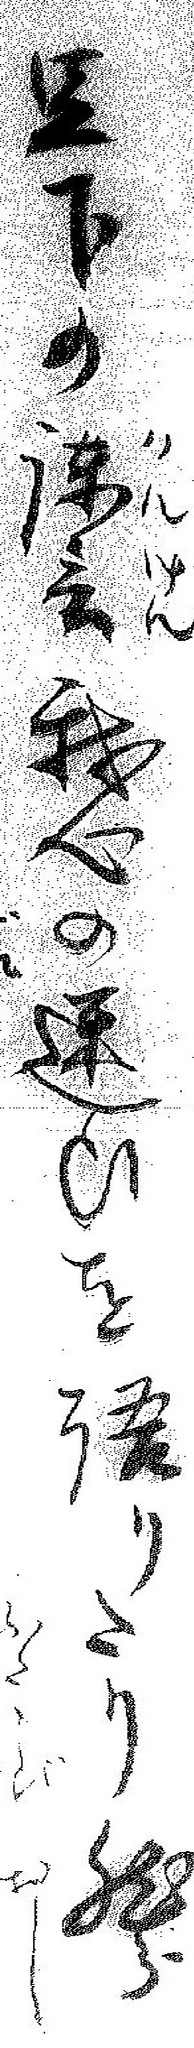足下の諫言我心の迷ひを語りたり然ら
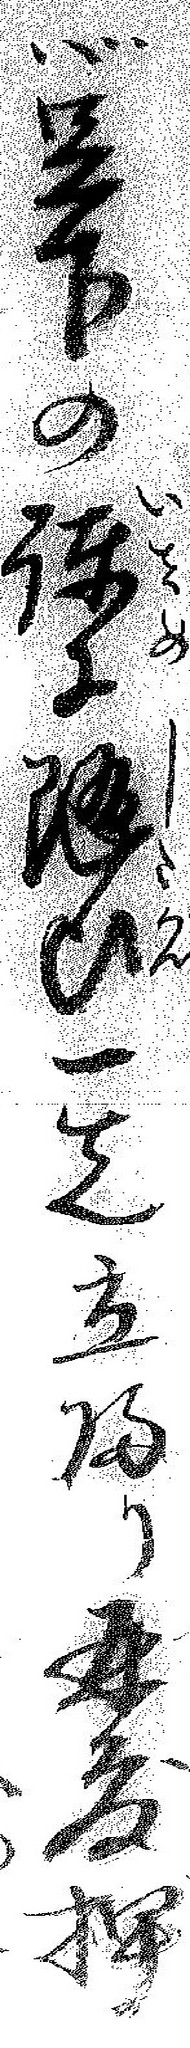ば足下の諫に随ひ一先立帰り再度押
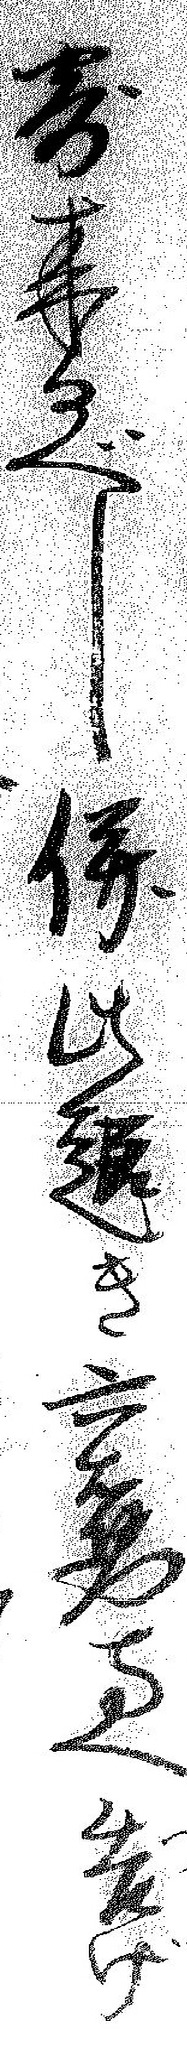寄来るべし併此趣き六右衛門方へ告げ
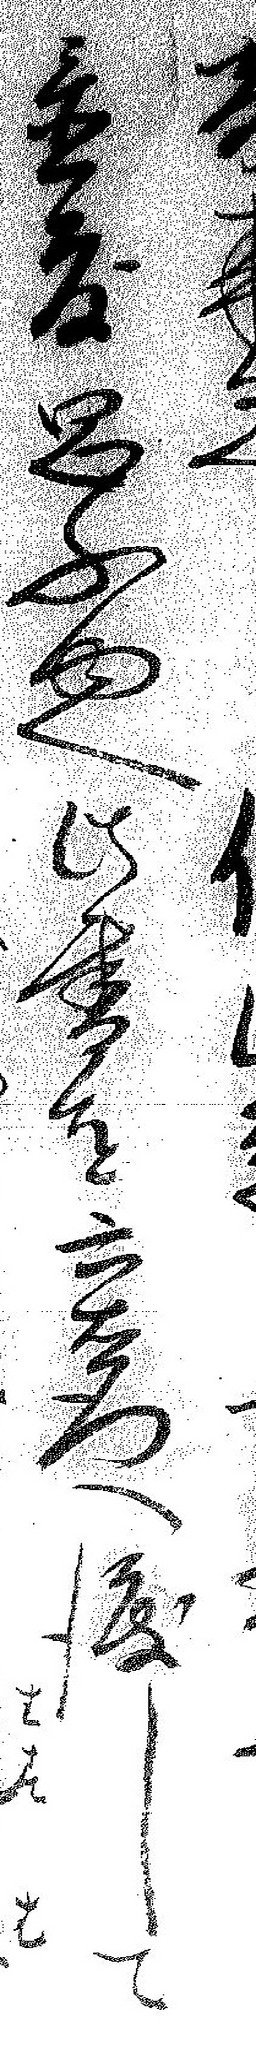置度思ふゆへ此書を六右衛門へ渡して
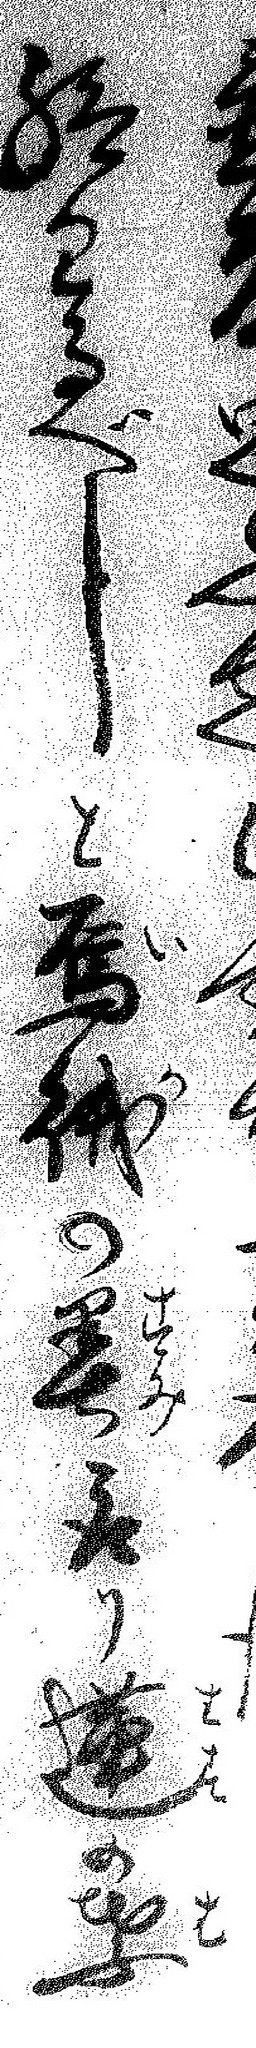給わるべしと烏賊の墨取り蓮の葉
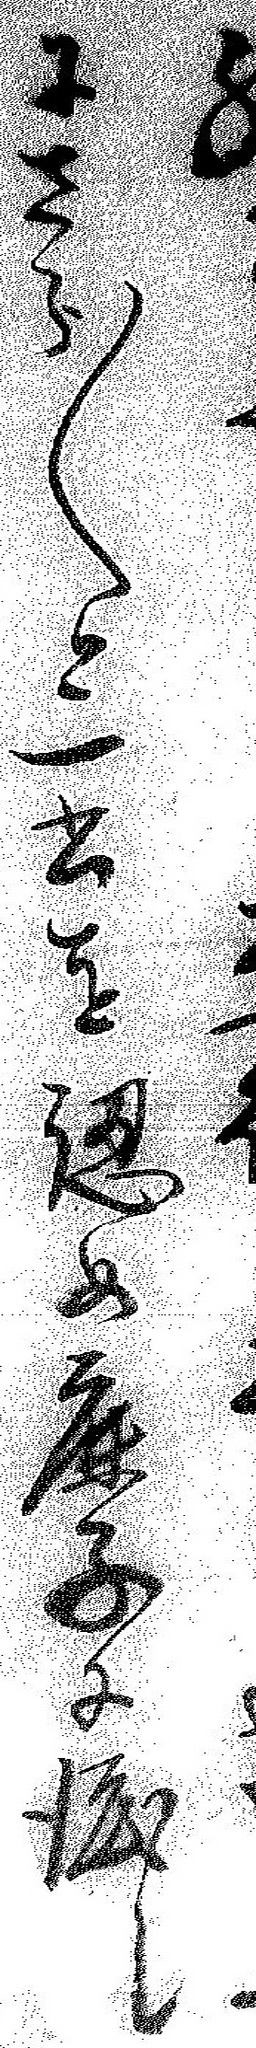にさら〳〵と一書を認め鹿子に渡し
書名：近頃古狸珍説　礼義智信
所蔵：徳島県立図書館
